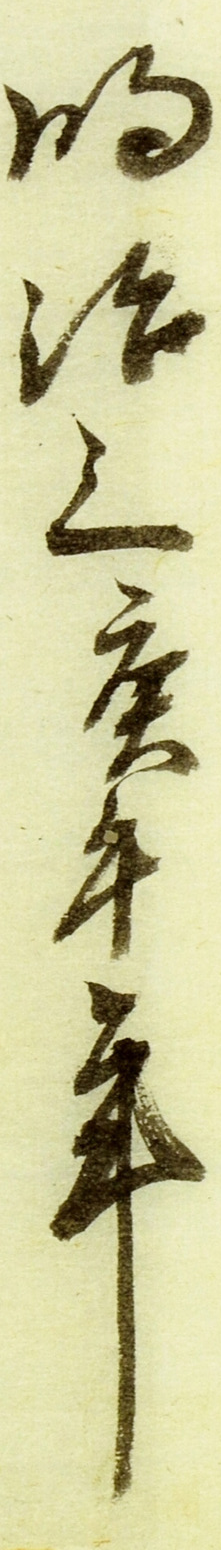明治三庚午年
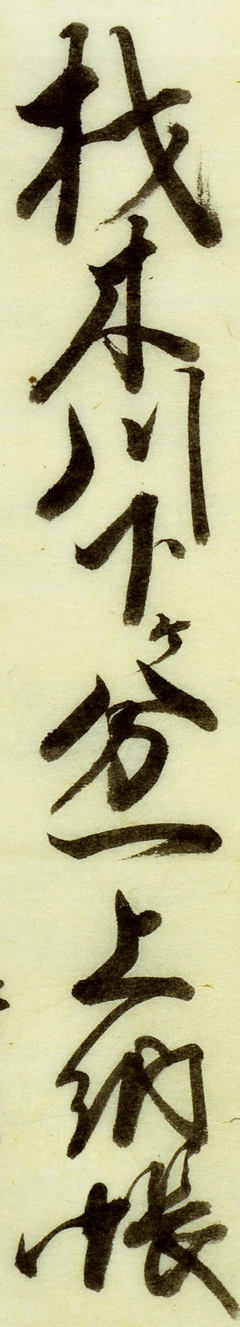材木川下ヶ分一上納帳

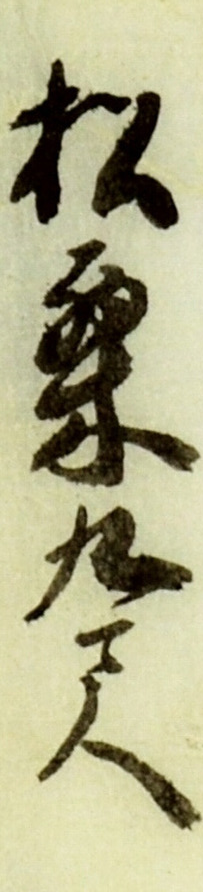松栗九尺
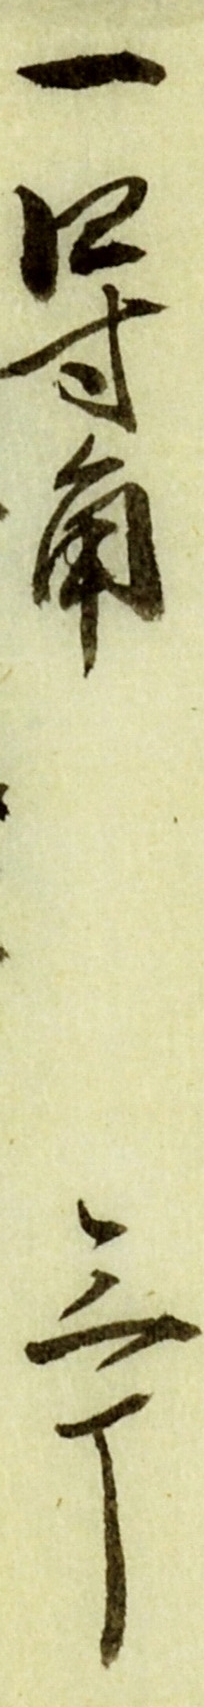一四寸角三丁
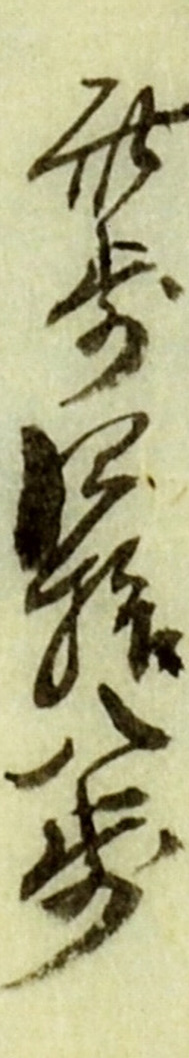此歩四拾八歩
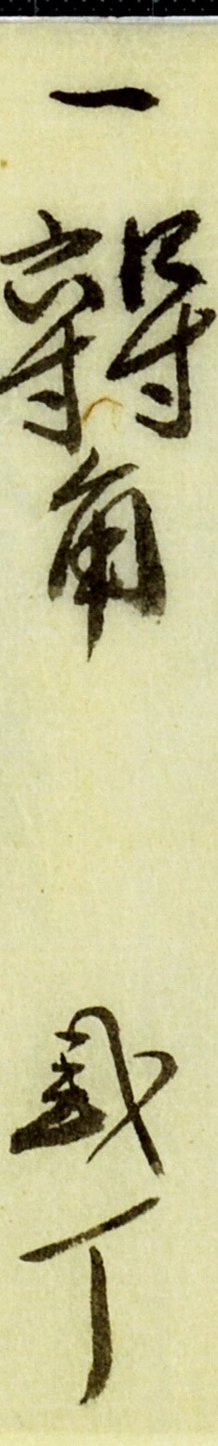一四寸角三丁
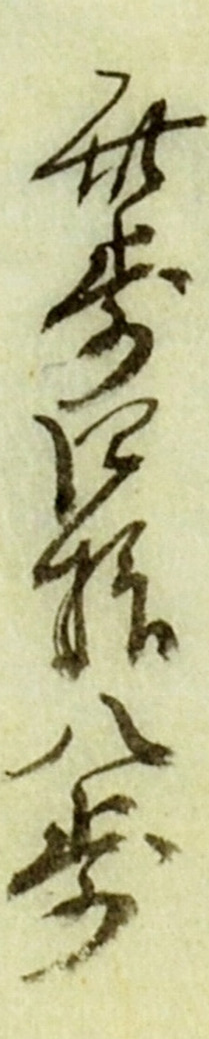此歩四拾八歩
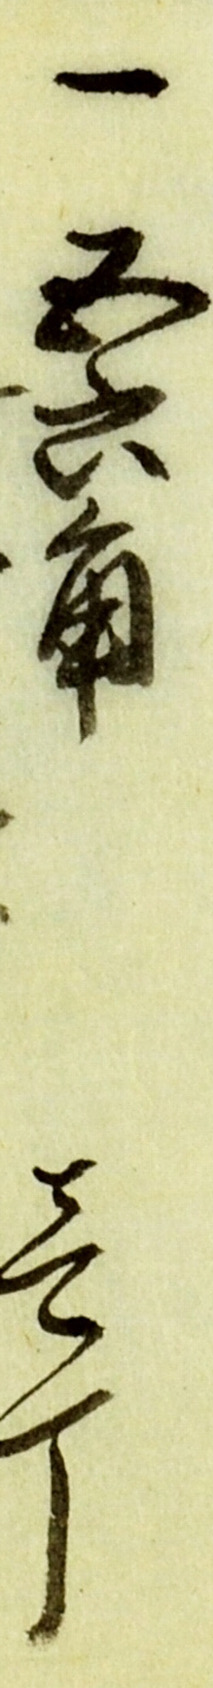一五六角壱丁
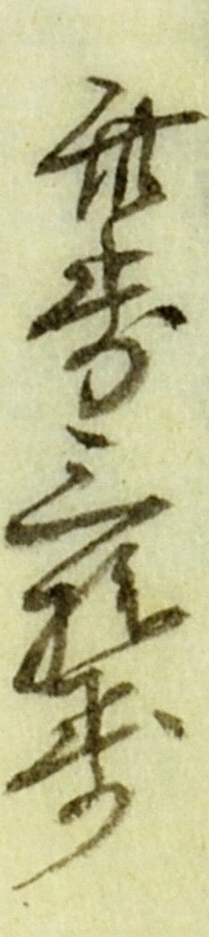此歩三拾歩
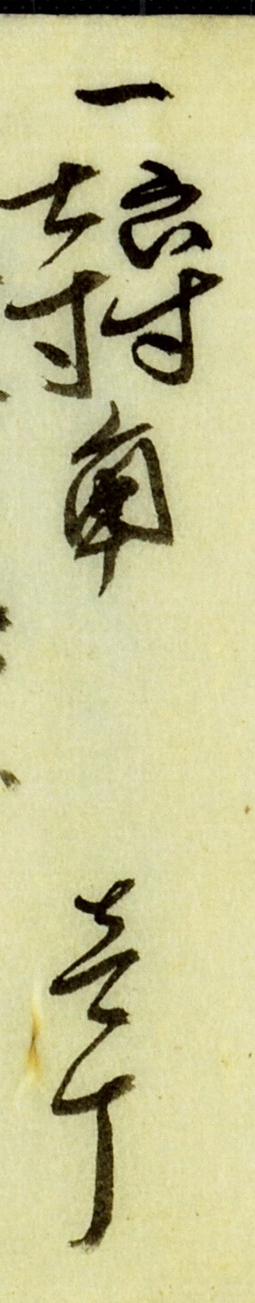一五六角壱丁
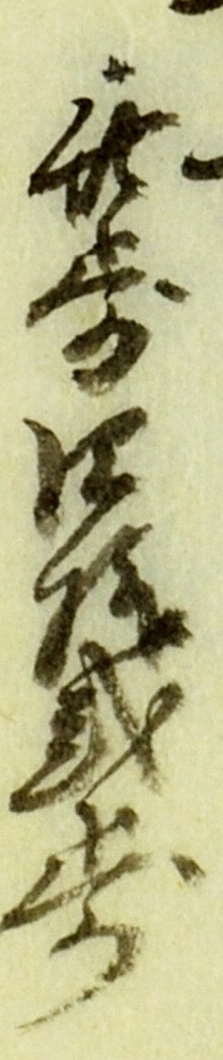此歩四拾弐分歩
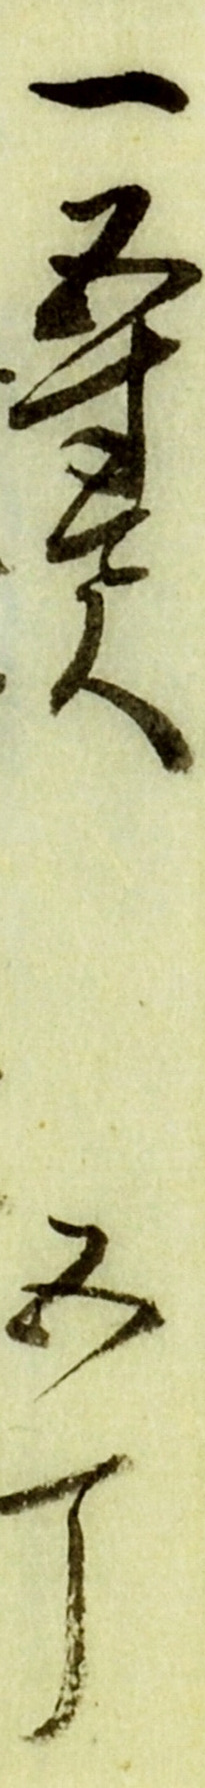一五寸尺五丁
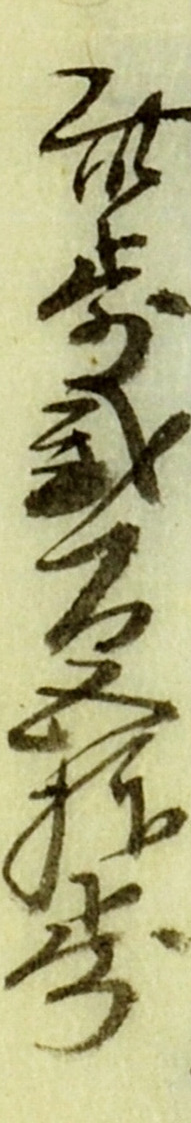此歩弐百五拾歩
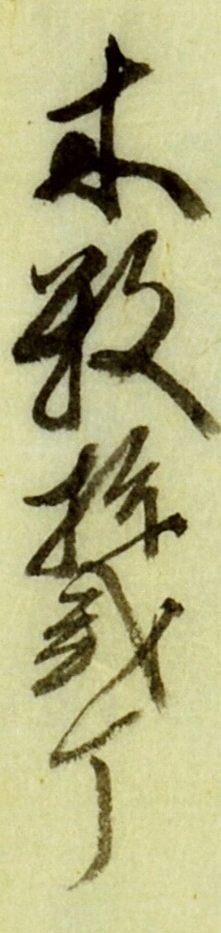木数拾弐丁
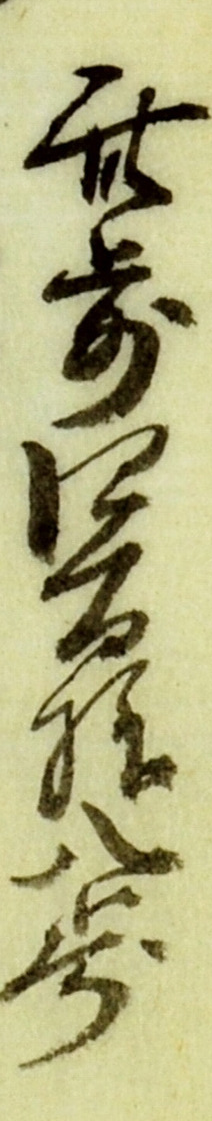〆此歩四百拾八歩
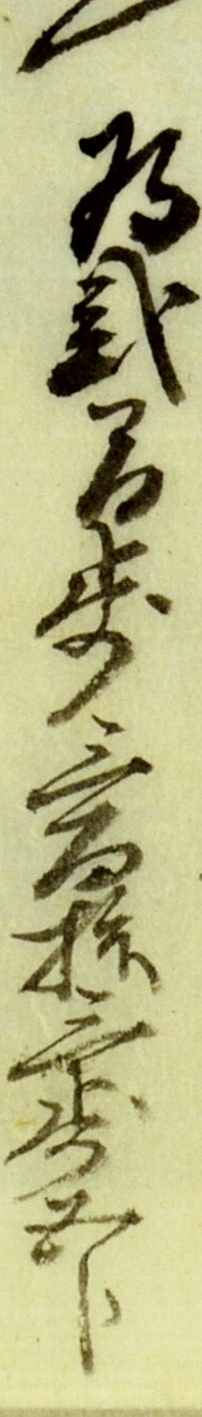為弐百歩三百拾三歩五分
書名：材木川下ケ分一上納帳
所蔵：伊那市立高遠町図書館・合同会社AMANE
